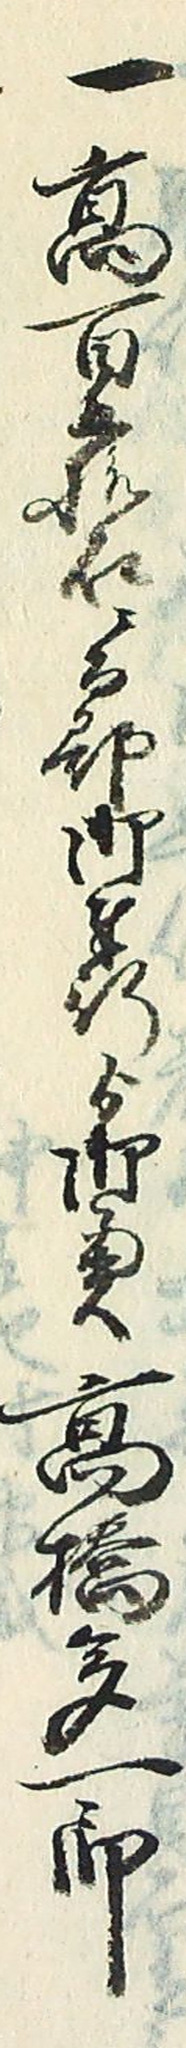一高百五拾石ニ而郡御奉行ゟ御奥高橋多一郎
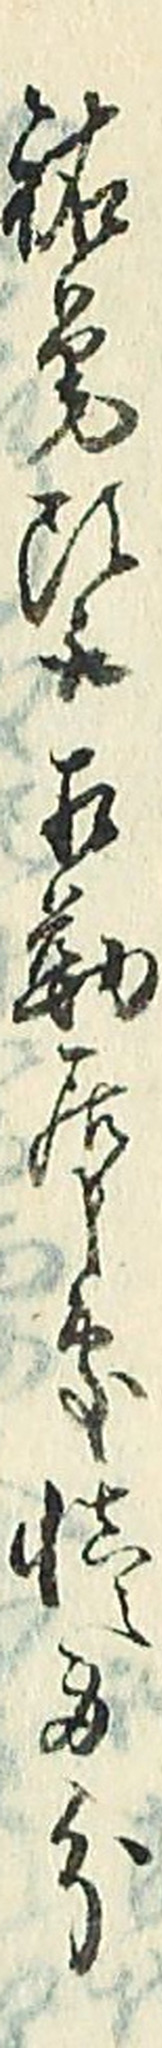祐筆頭取相勤居申處慎之身分
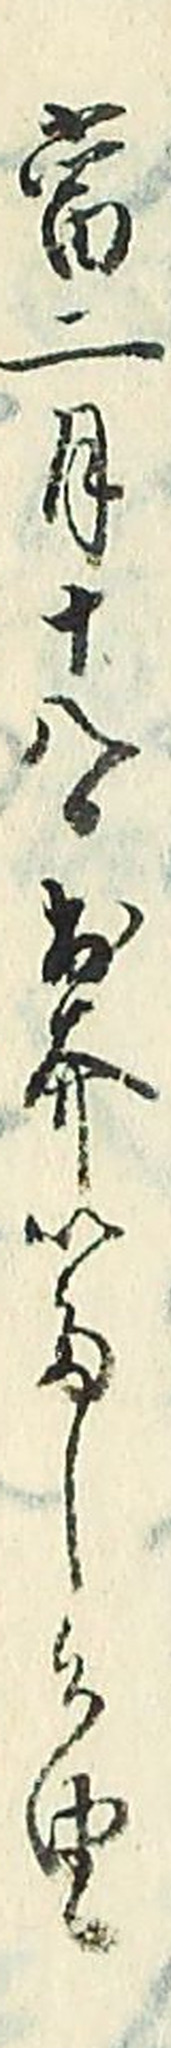當二月十八日出奔いたし候由
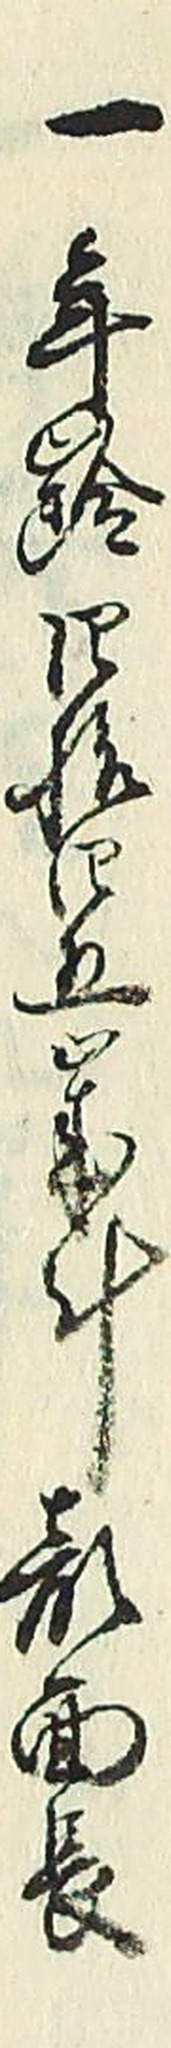一年齢四拾四五歳計顔面長
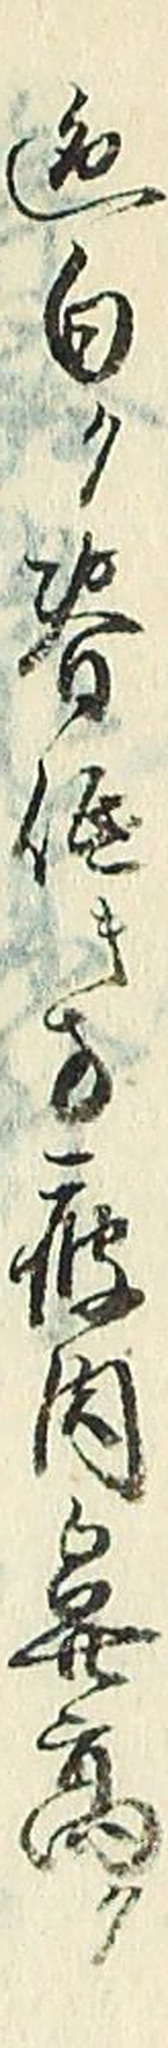色白ク脊低キ方痩肉鼻高ク
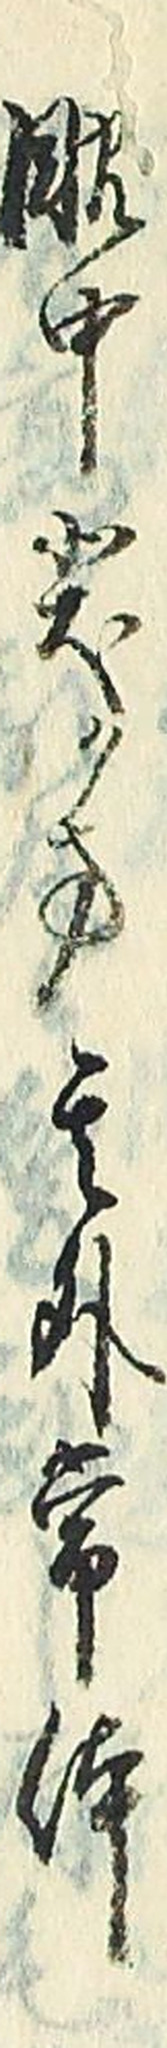眼中尖ク方其外常体
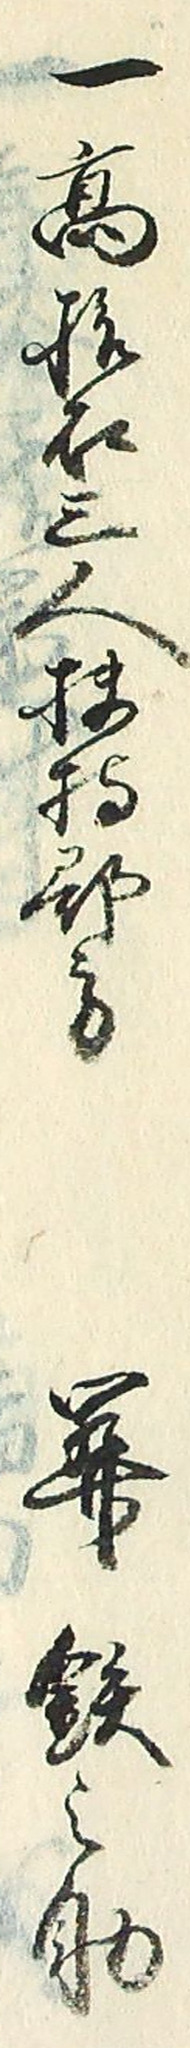一高拾石三人扶持郡方関鉄之助
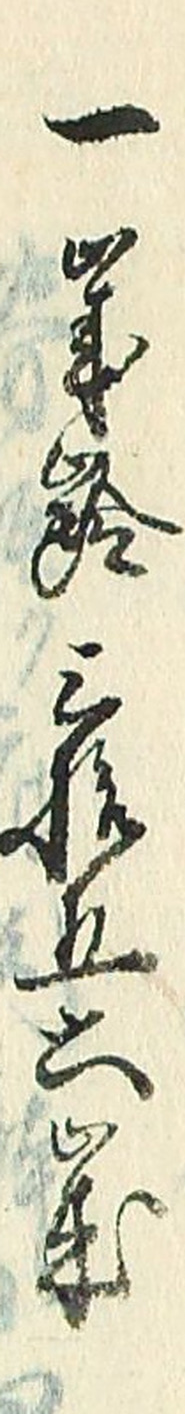一歳齢三拾五六歳
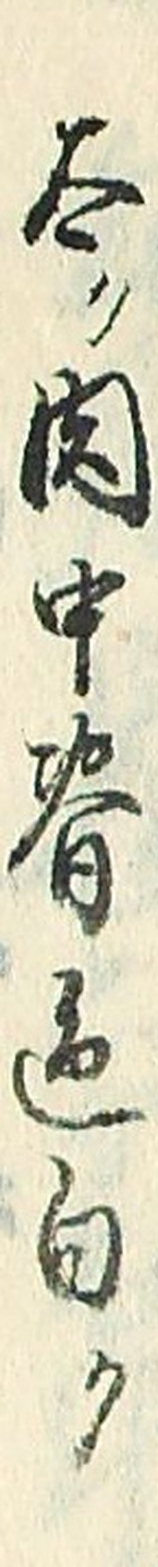太ク肉中脊色白ク
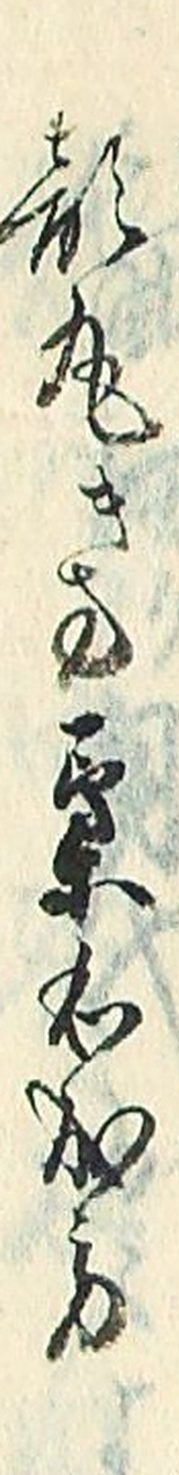顔丸キ方柔和成方
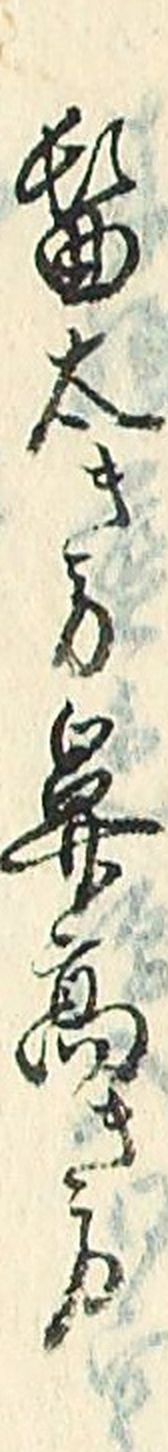髷太キ方鼻高キ方

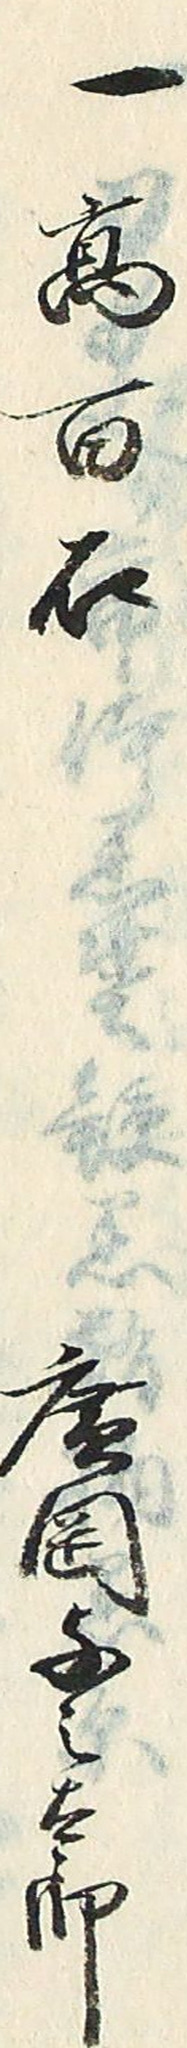一高百石廣岡与之太郎
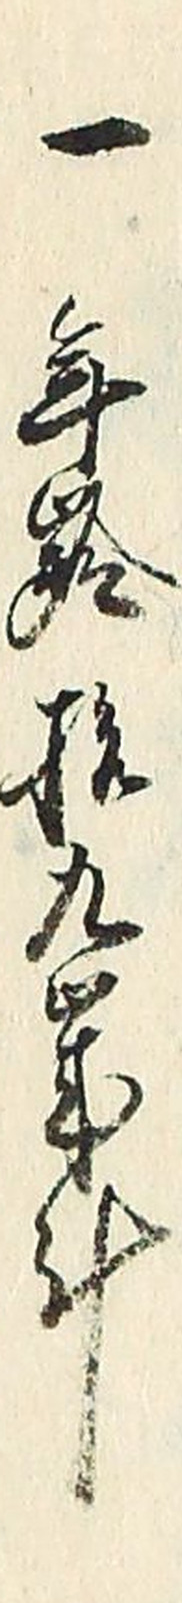一年齢拾九歳計
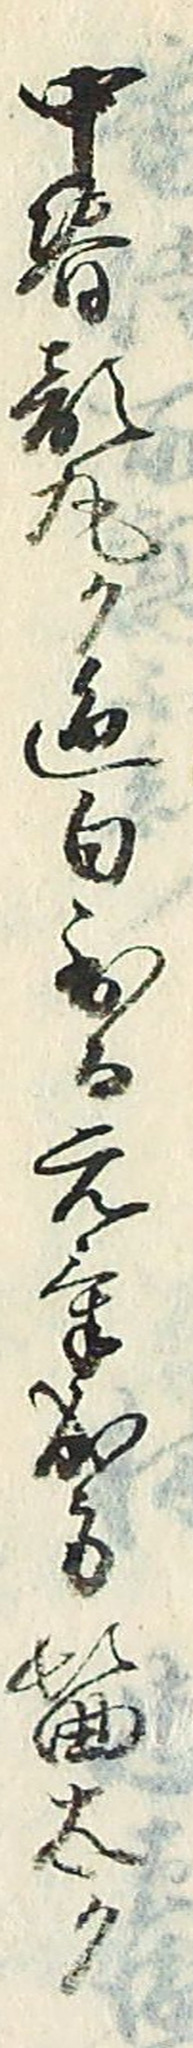中脊顔丸ク色白至而元気成方髷太ク
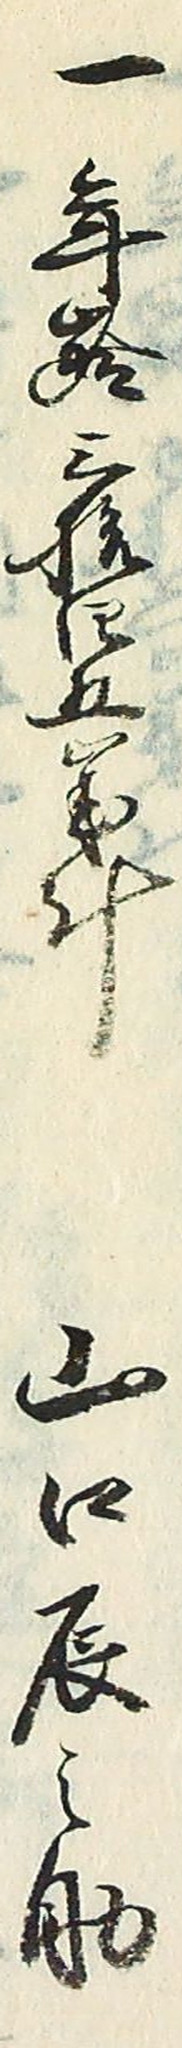一年齢三拾四五歳計山口辰之助
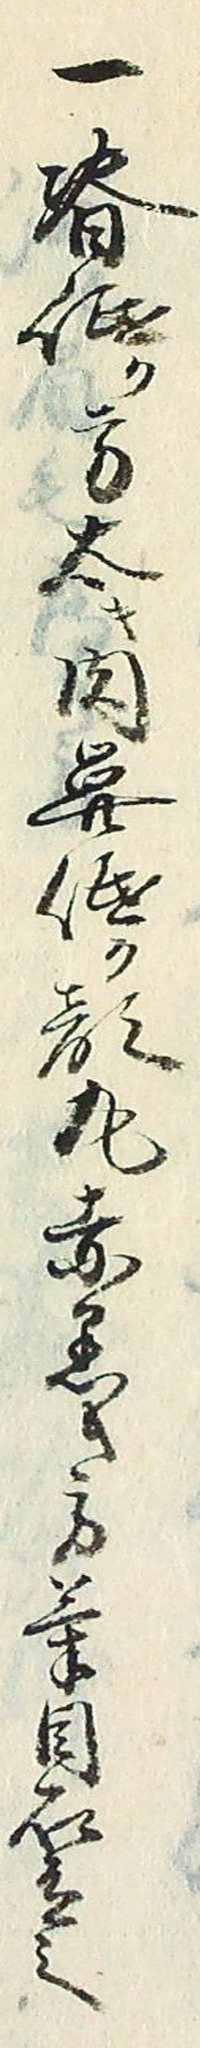一脊低ク方太キ肉鼻低ク顔丸赤黒キ方菊目石有之
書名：諸御趣意書并御下知向之写
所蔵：鳴門教育大学 Naruto University of Education
